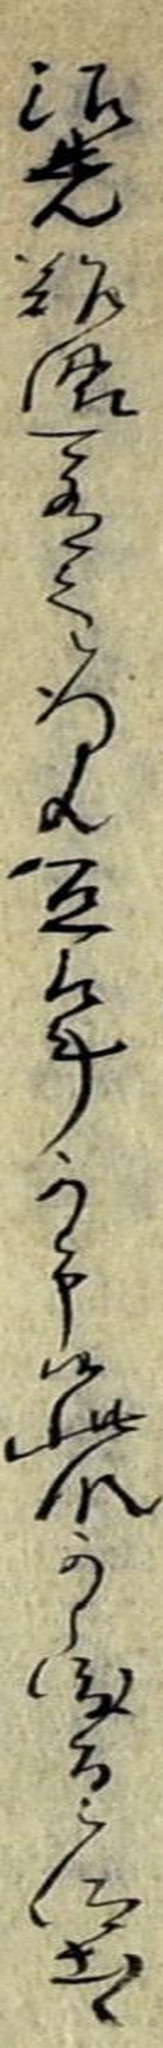銀先難渋可有之候得共宜取斗可被申候此段可被申渡旨被仰出候
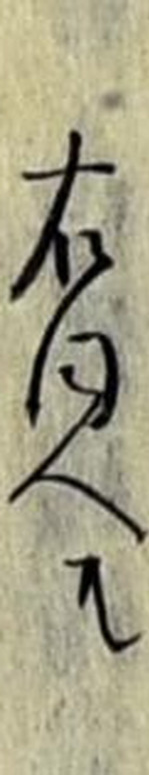右同人共
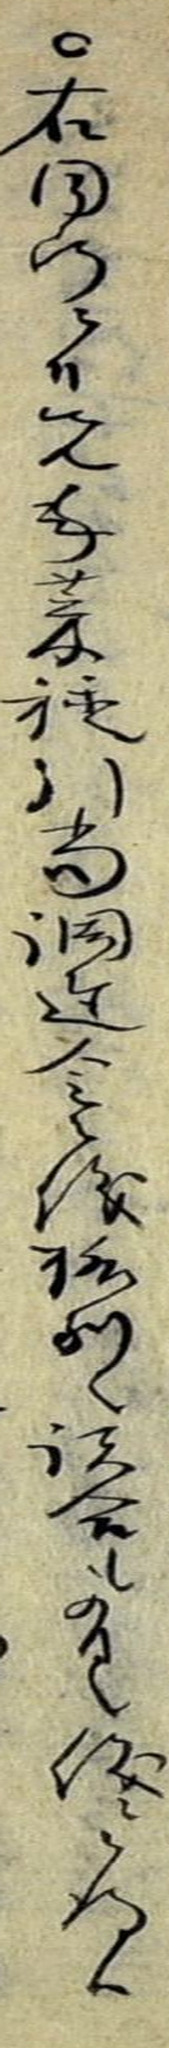○右同断に付先年菜種引当調達金之儀格別之訳合も有之儀に候得は
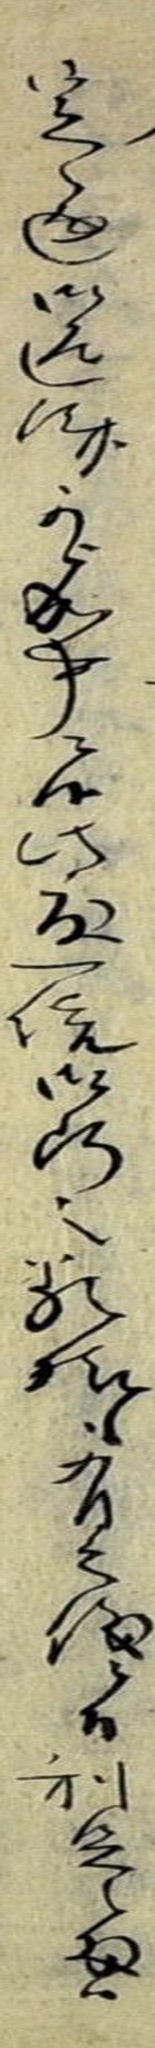御元之通御返済可被成事に候此度一統御断之類様も有之儀に付利息之義は
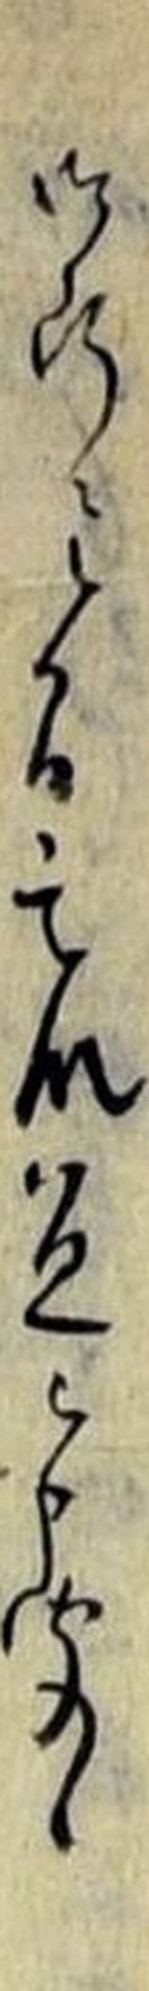御断に候間其段宜被申聞候
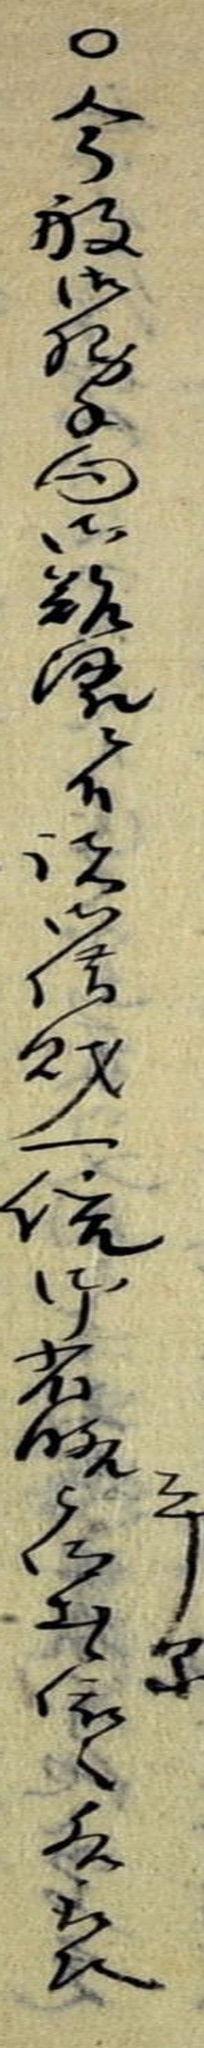○今般御勝手向御難渋に付諸御借財一統御省略被仰出候依之各取候
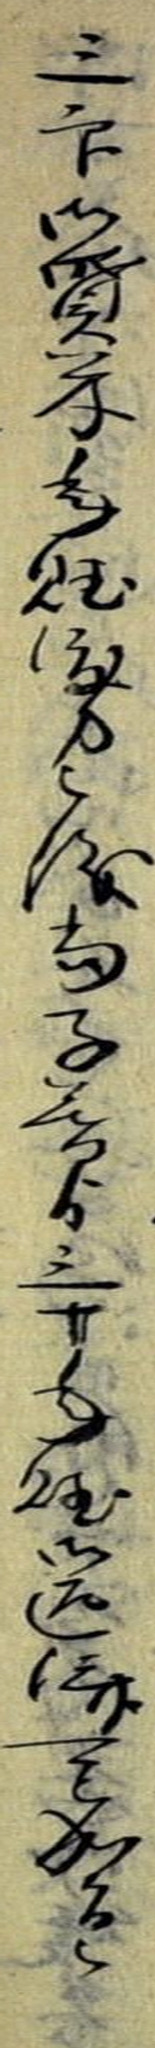三印御貸米年賦渡方之儀当子年ゟ三十年賦御返済可被成旨被
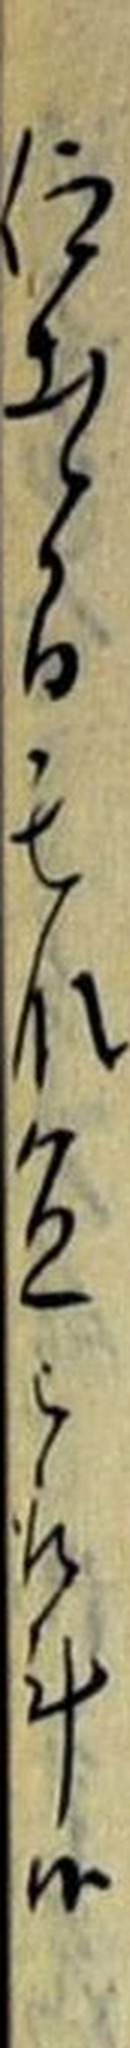仰出候間其段宜被取斗候
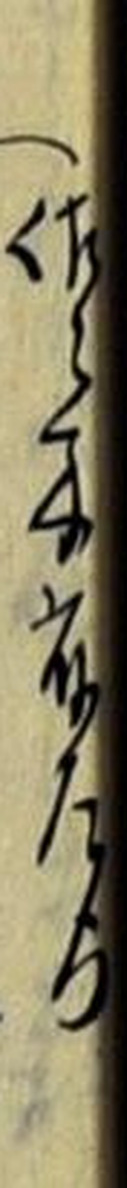佐々木藤左衛門
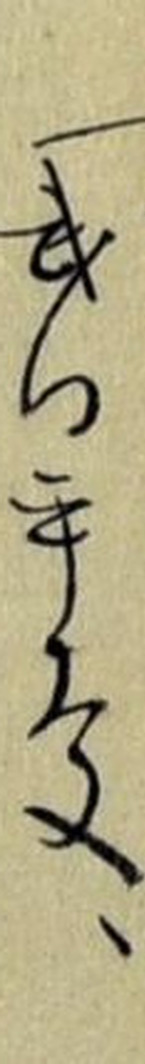武田平太夫
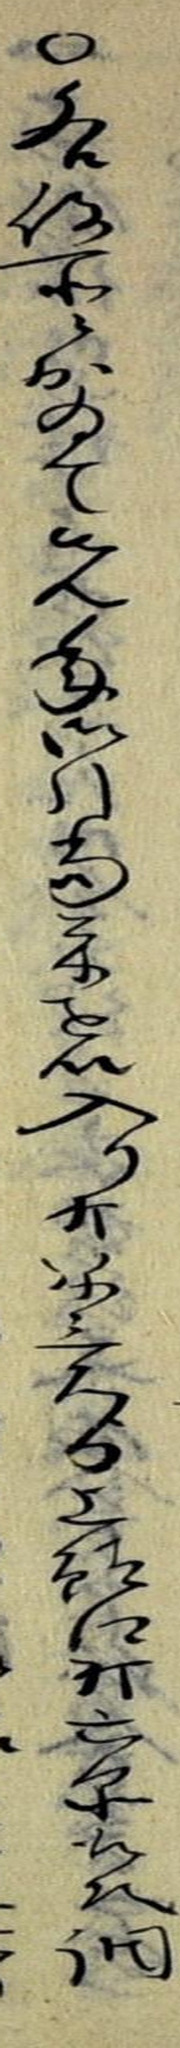○各役所におゐて先年御引当米を以入り村弥三左衛門上鯖江村六兵衛取候調
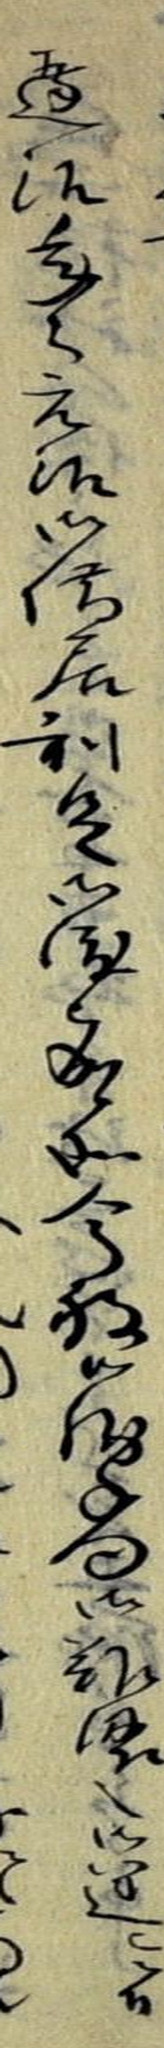達銀年々元銀御借居利息御渡被成候処今般御勝手向御難渋之御運ひに付
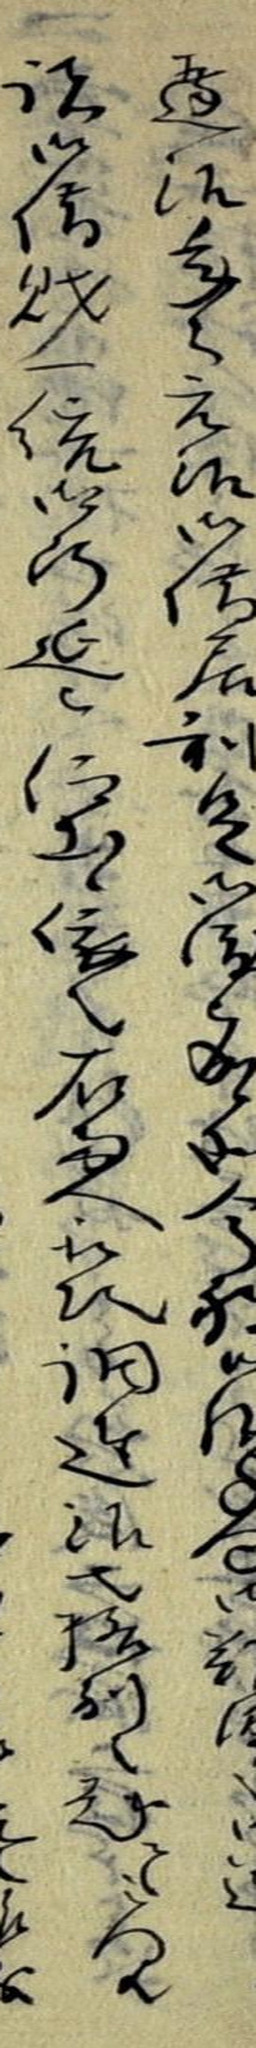諸御借財一統御断延被仰出候依之右両人取候調達銀は格別之趣にも候得共
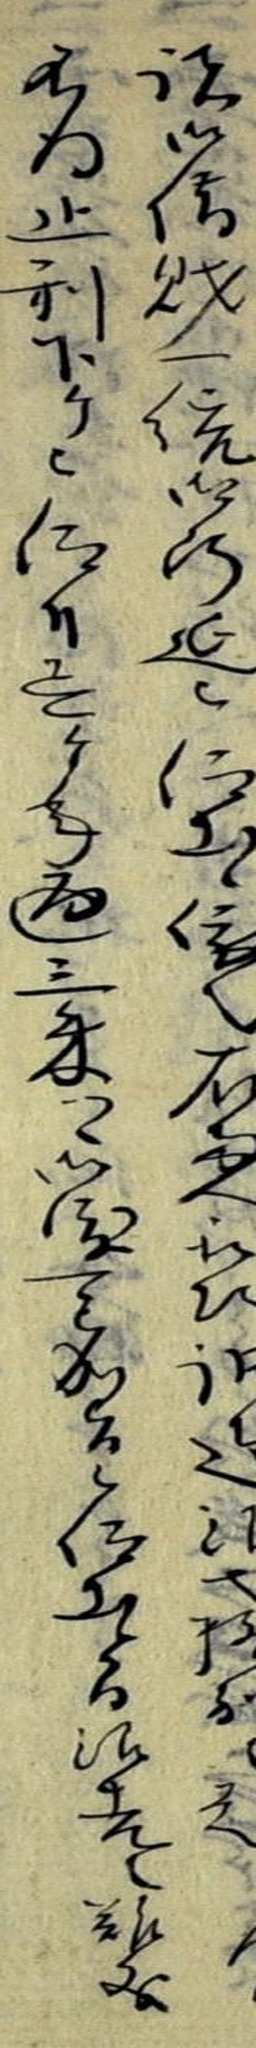不得止利下ヶ被仰付壱ヶ年通三朱つヽ御渡可被成旨被仰出候間銀先之難義
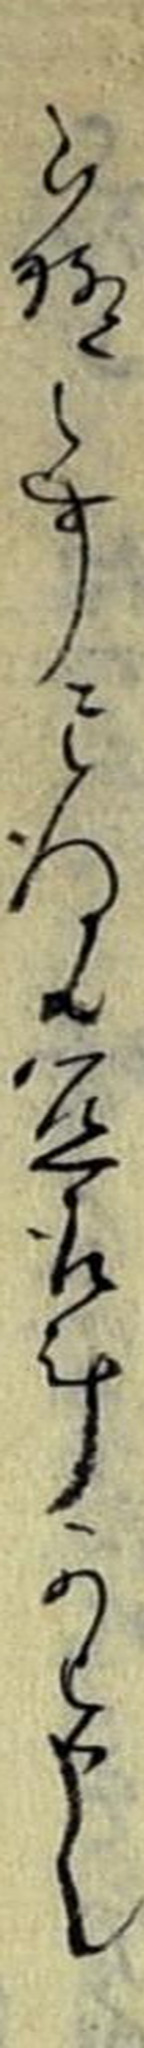至極之事に候得共宜取斗可被申候
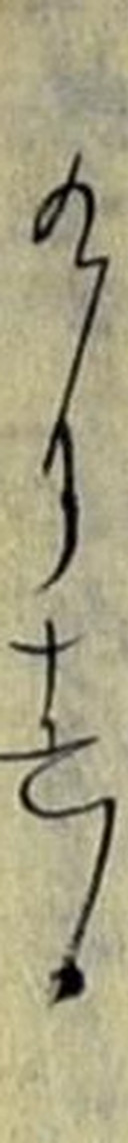九月十六日
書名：命令之部 四
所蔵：福井県文書館 Fukui Prefectural Archives
